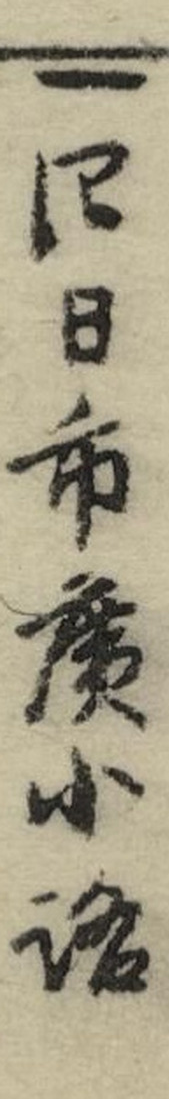一四日市広小路一
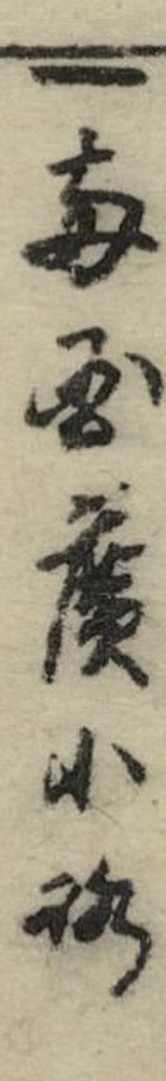一両国広小路二
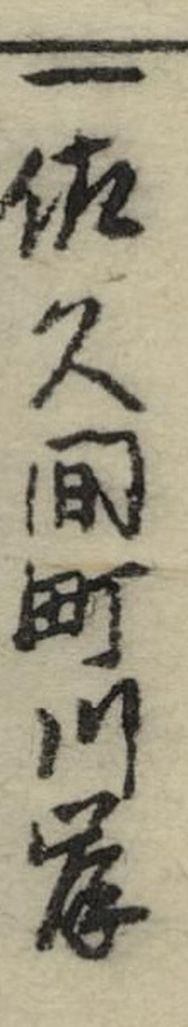一佐久間町川岸一
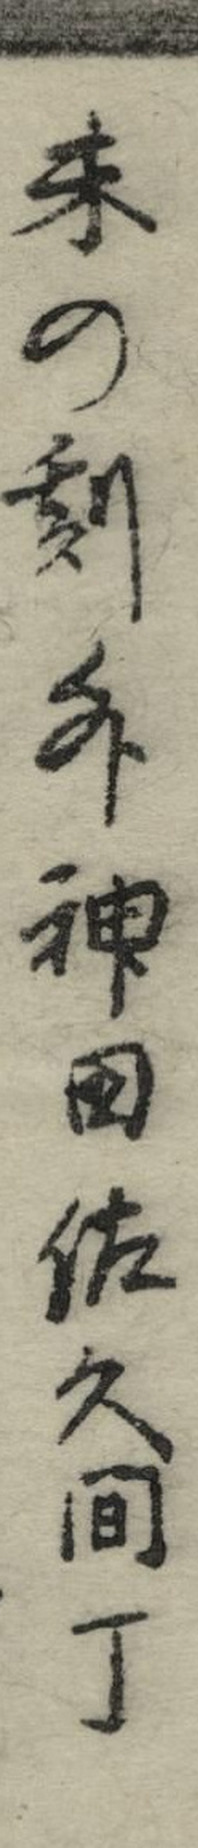未の刻外神田佐久間丁
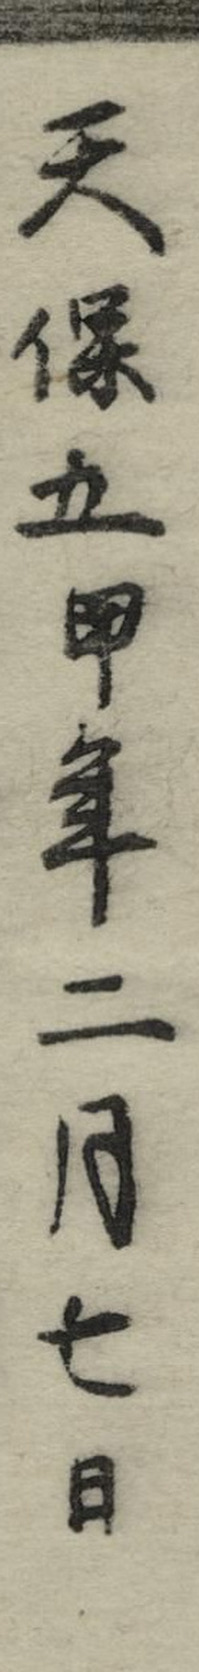天保五甲年二月七日
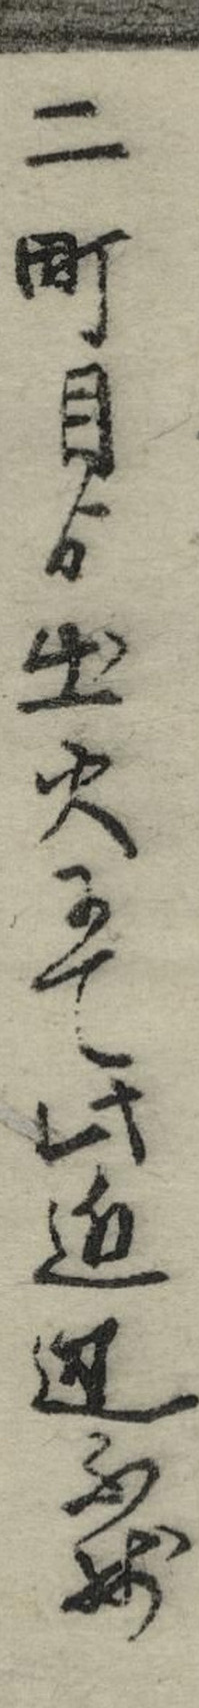二町目ゟ出火にて此近辺不残
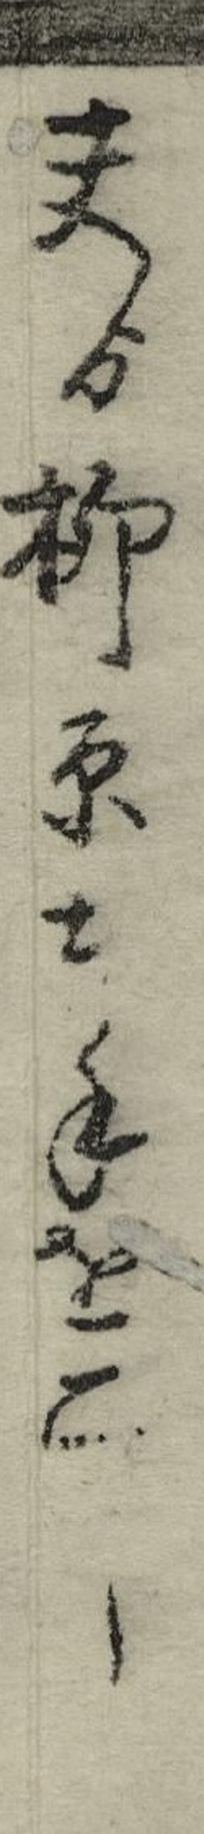夫ゟ柳原土手をこし
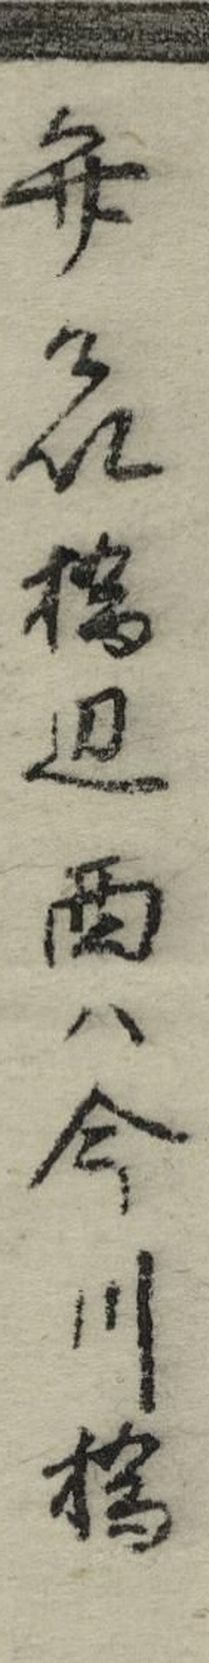弁けい橋辺西は今川橋
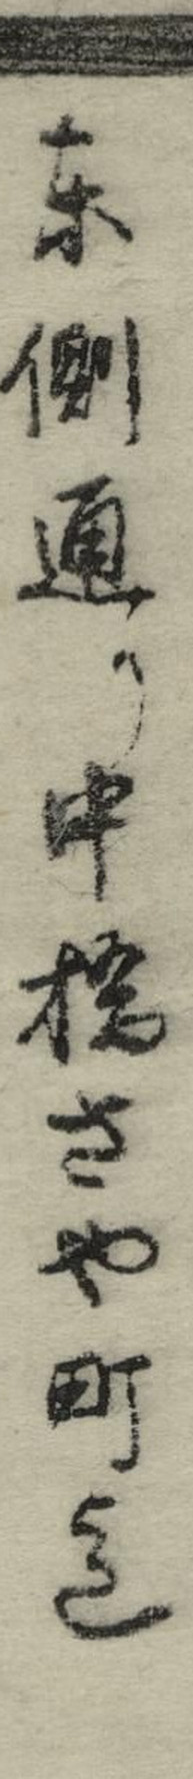東側通り中橋さや町迄
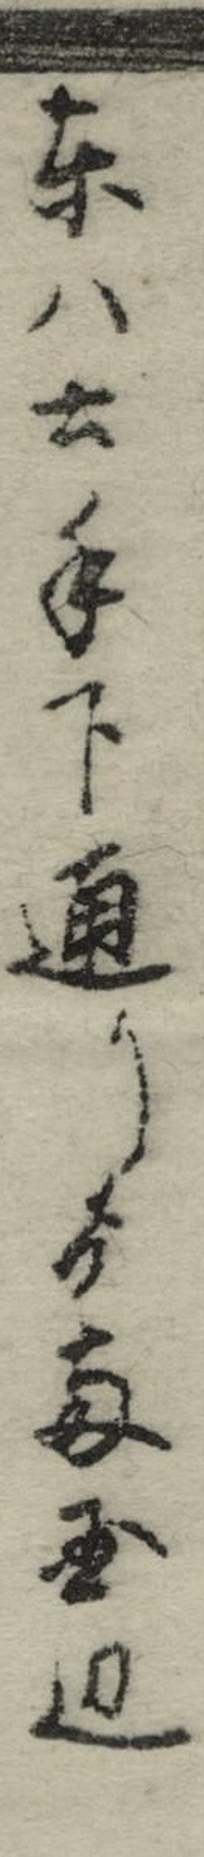東は土手下通りゟ両国辺
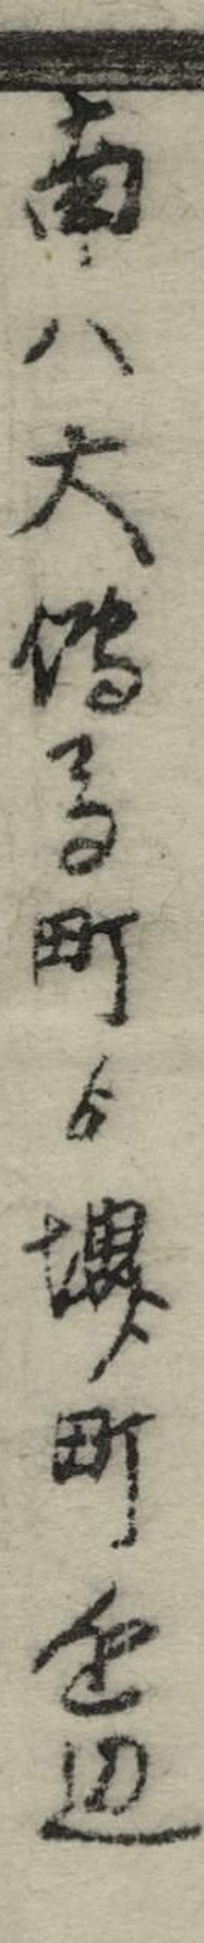南は大伝馬町ゟ堺町近辺
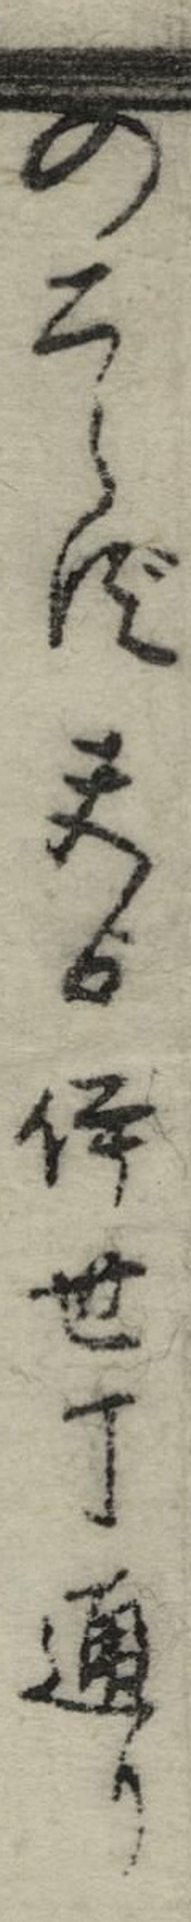のこらず夫ゟいせ町通り
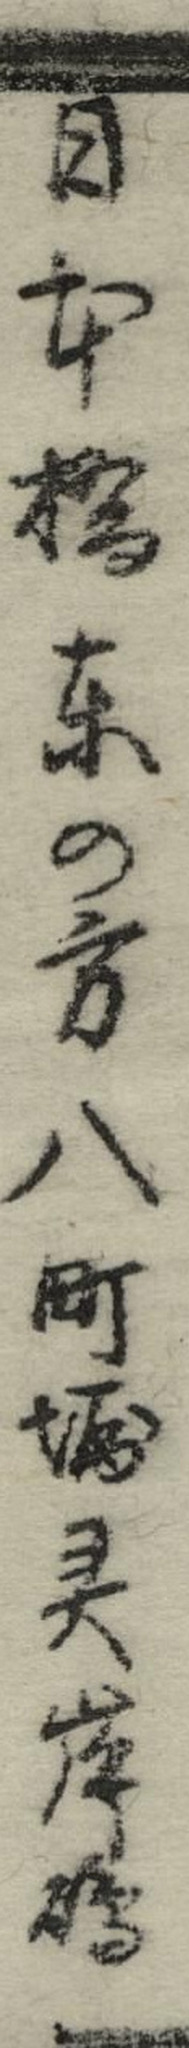日本橋東の方八町堀霊岸嶋
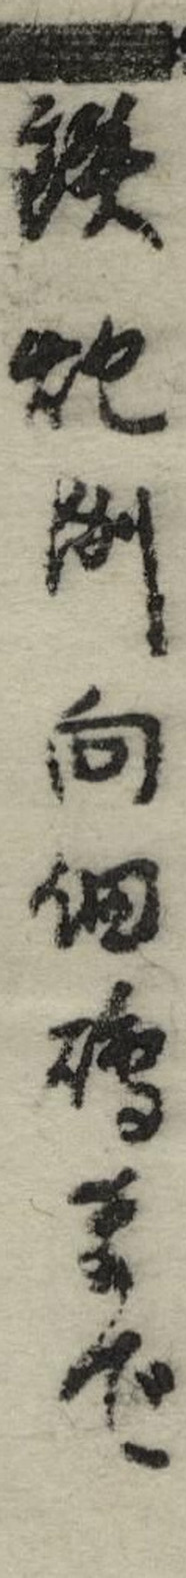鉄炮洲向佃嶋まで
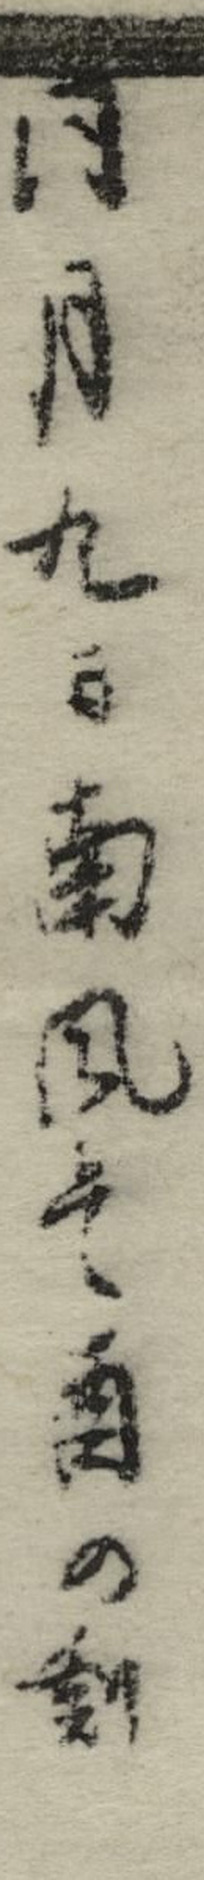同月九日南風にて酉の刻
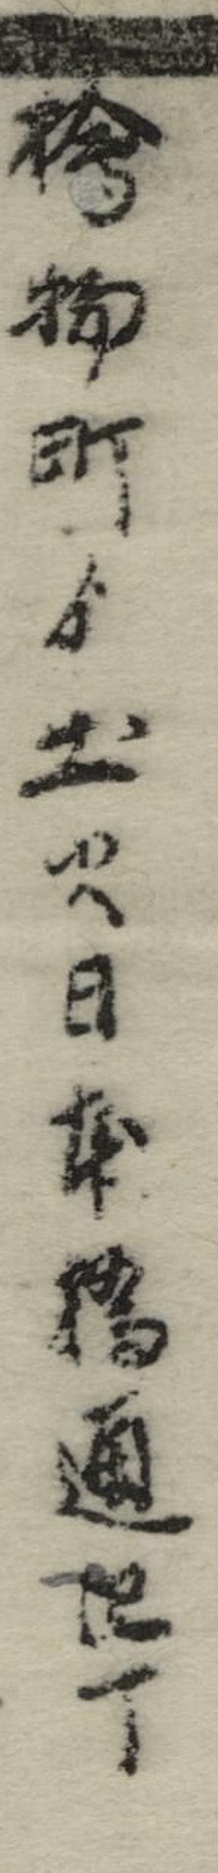檜物町ゟ出火日本橋通四丁
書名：[天保五年二月の江戸大火に関する瓦版]
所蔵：東京大学地震研究所図書室 Earthquake Research Institute Library, The University of Tokyo, JAPAN
